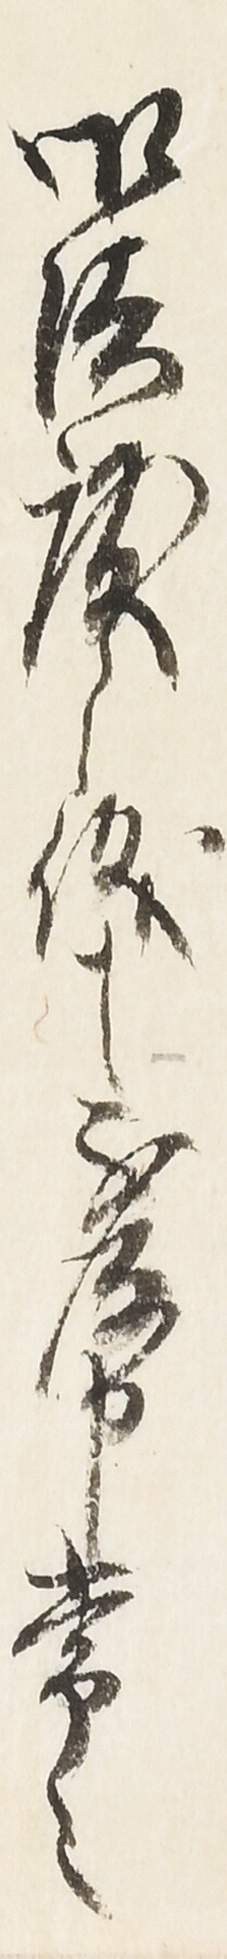御法度之儀者不及申常々
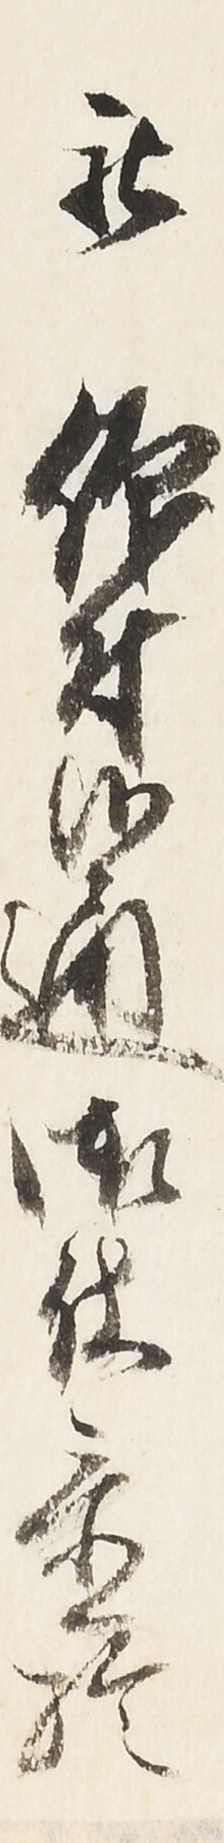被仰付候通御仕置於
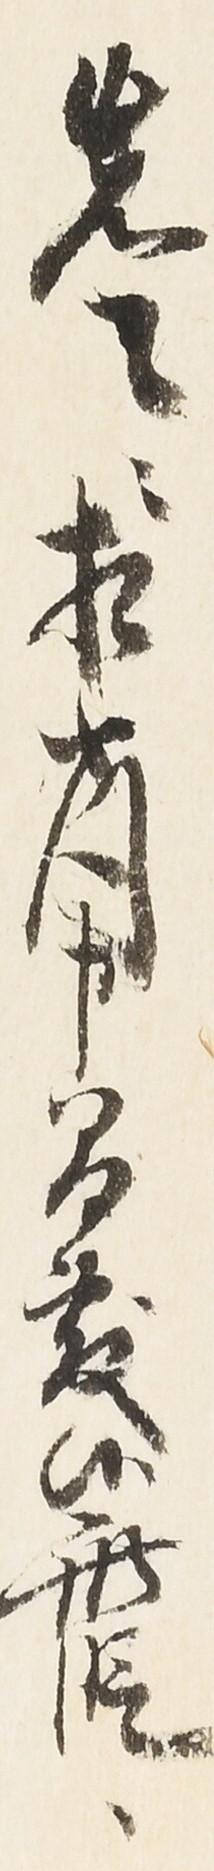先々ニ相背申間敷候此段
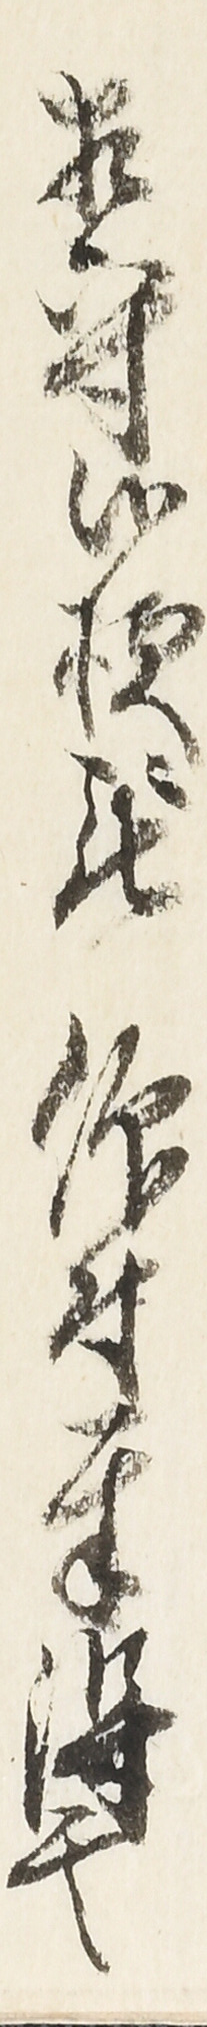相守候様ニ被仰付奉得其
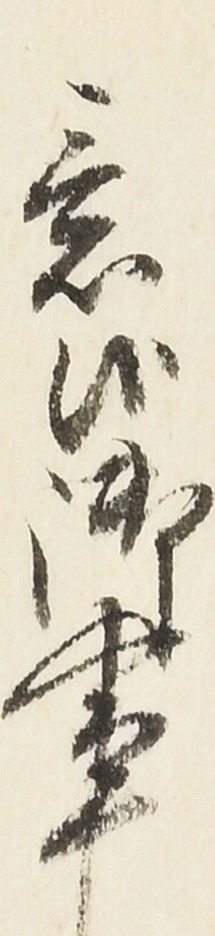意候御事
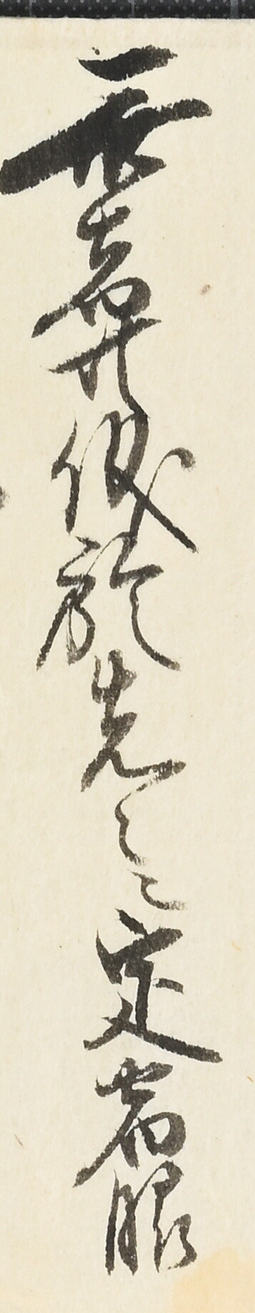一此者共儀於先々ニ定宿脇
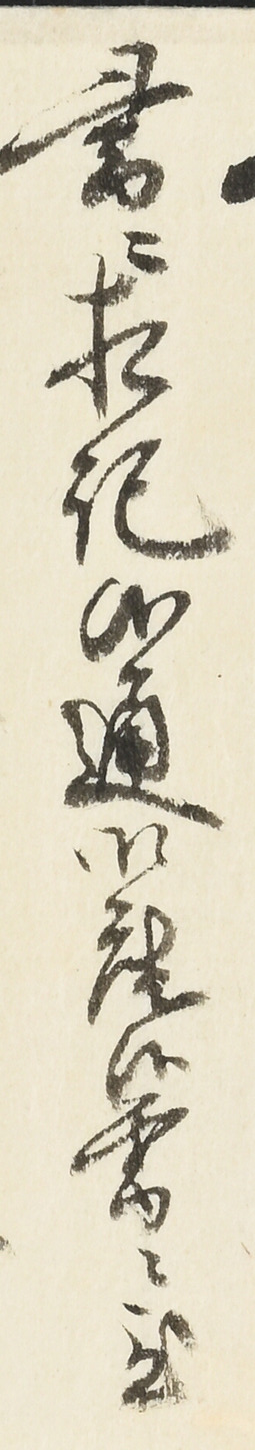書ニ相記候通御座候暮ニ至
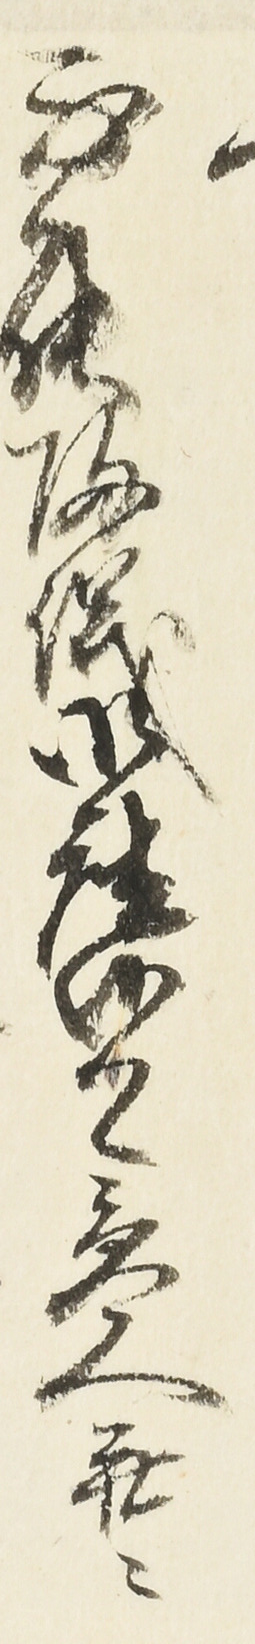不罷帰儀御座候ハヽ受人并ニ
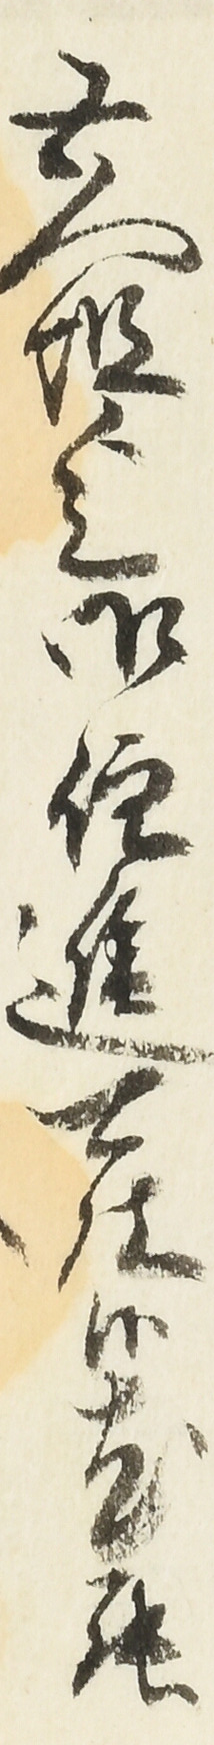五人組迄御注進可仕候尤罷
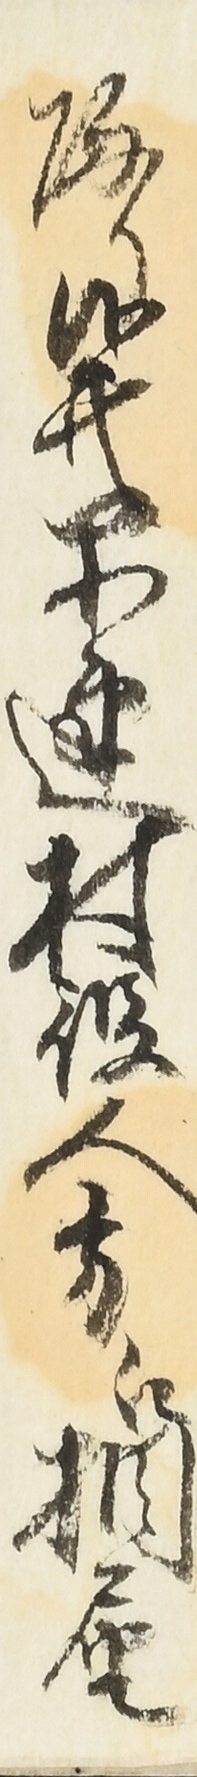帰り候共早速村役人方江相届

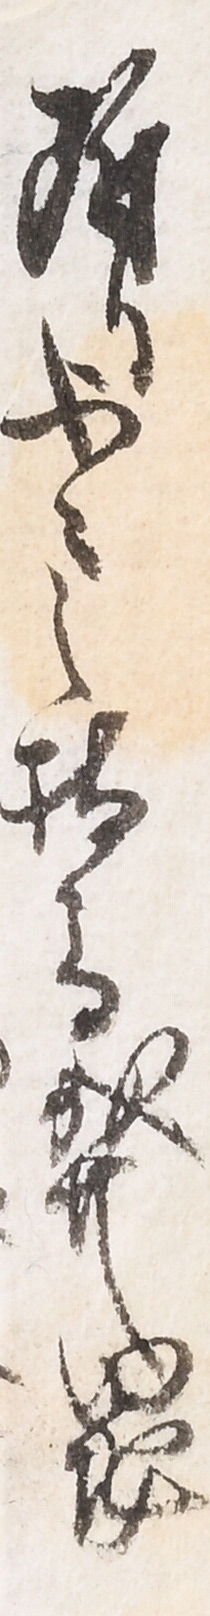附り少々之持高成共田地
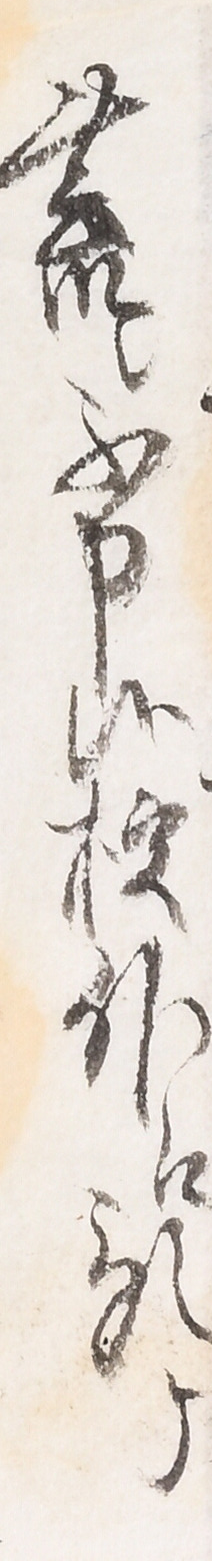荒し不申候様外江預ヶ
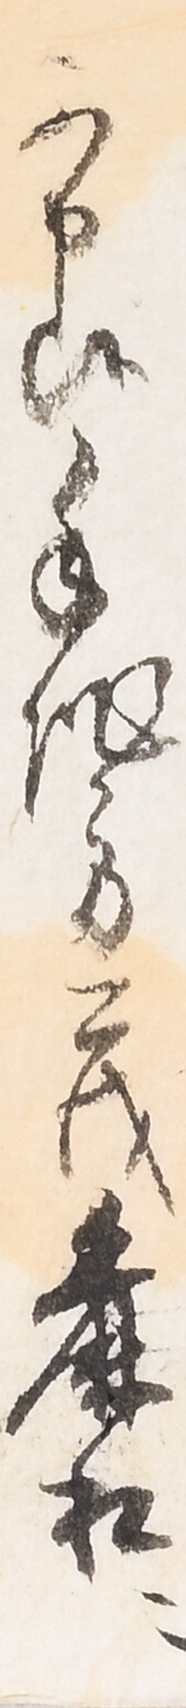可申候手作方茂麁相ニ
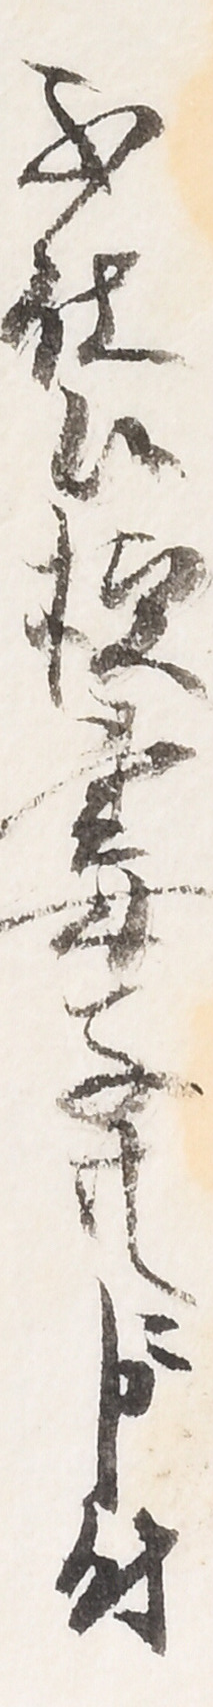不仕候様妻子共ニ申付
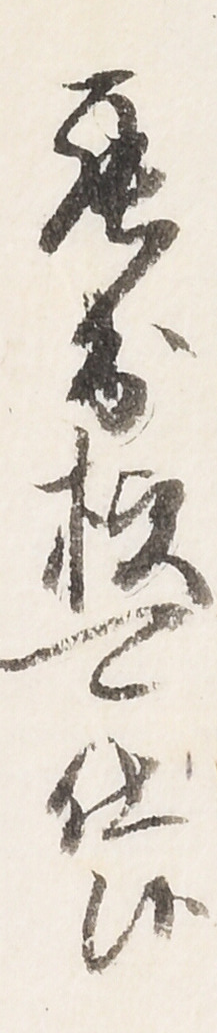罷出様可仕候
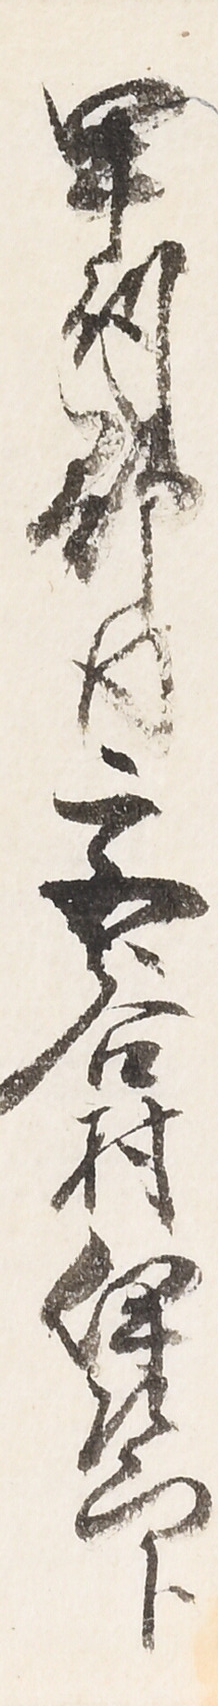甲州郡内宮谷村伊左衛門ト
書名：文久三癸亥年二月日他国石切稼書上帳
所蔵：伊那市立高遠町図書館・合同会社AMANE
